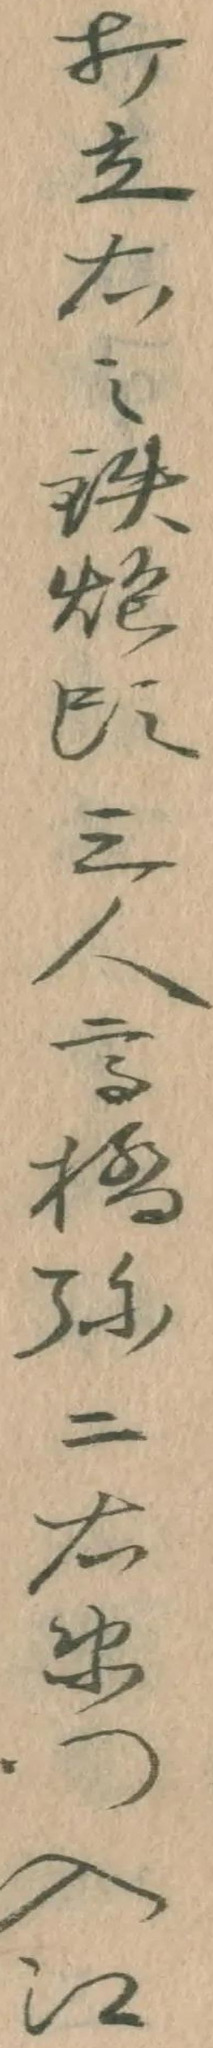打立右之鉄炮頭三人高橋弥二右衛門入江
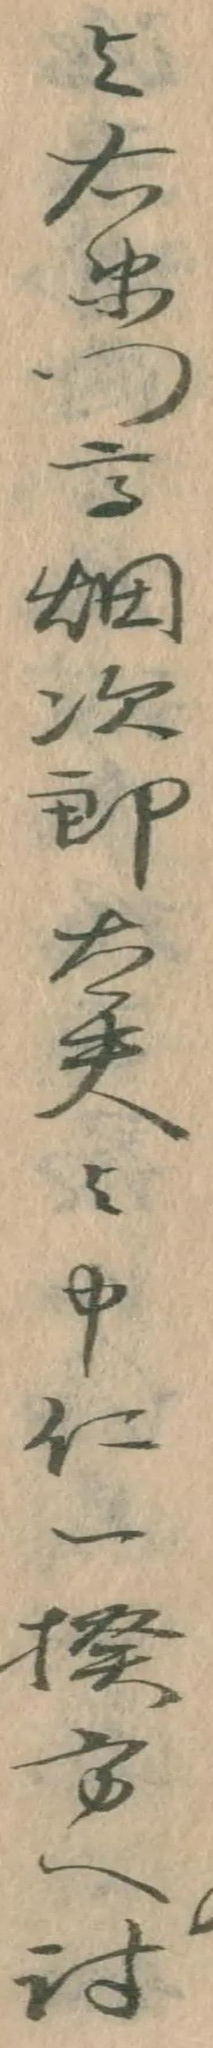与右衛門高畑次郎太夫与申仁一揆方へ討
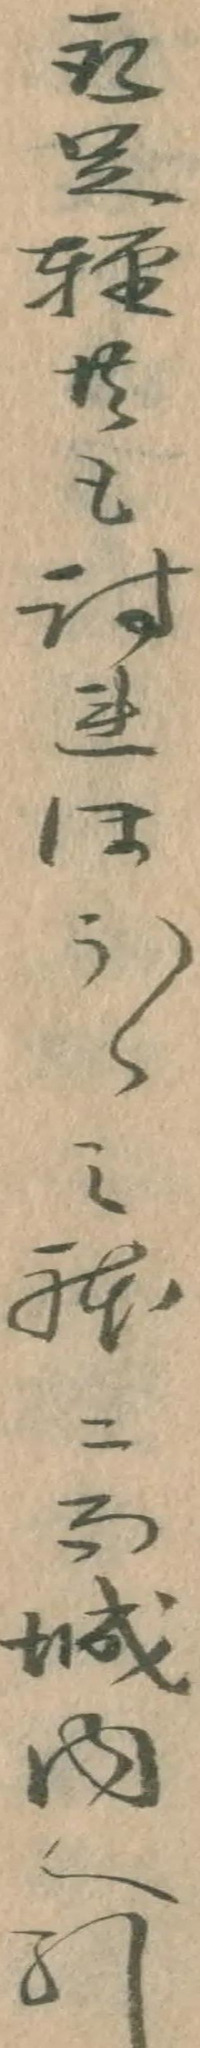取足軽共も討連ほう〱之躰に而城内へ引
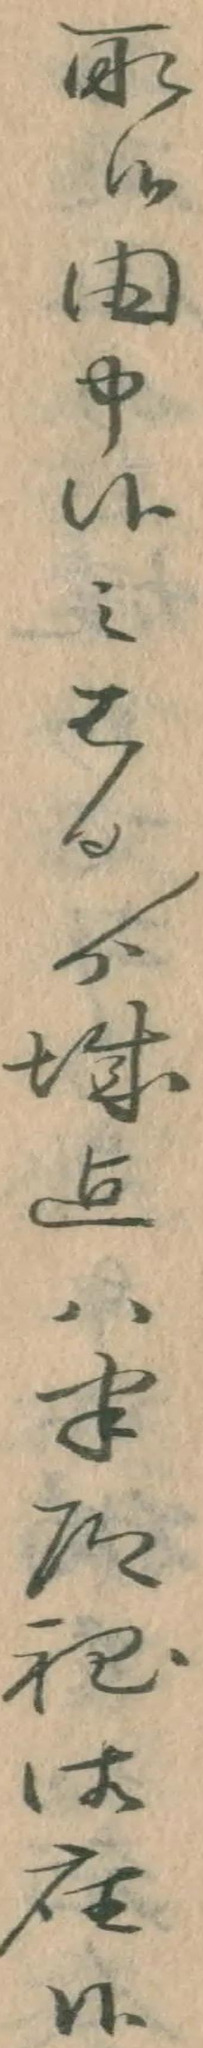取候由申候みはるゟ城迄は半道程御座候
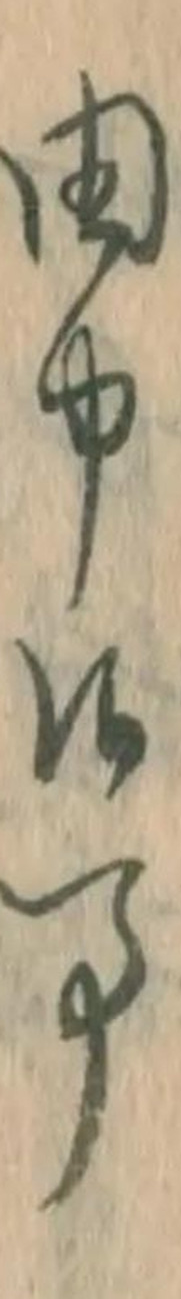由申候事
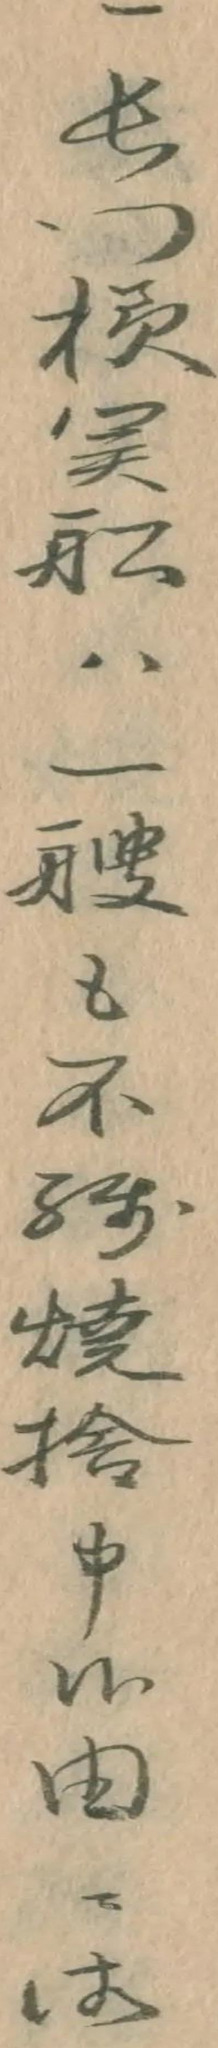一長門様関舩は一艘も不残焼捨申候由に御

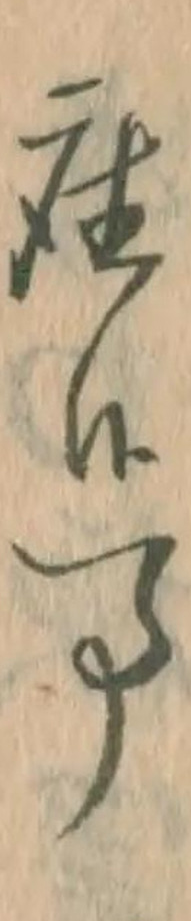座候事
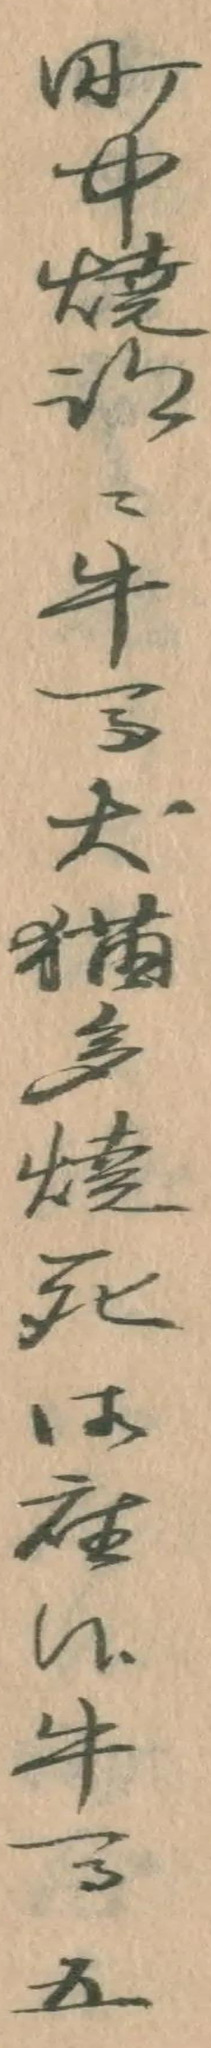一町中焼跡に牛馬犬猫多焼死御座候牛馬五
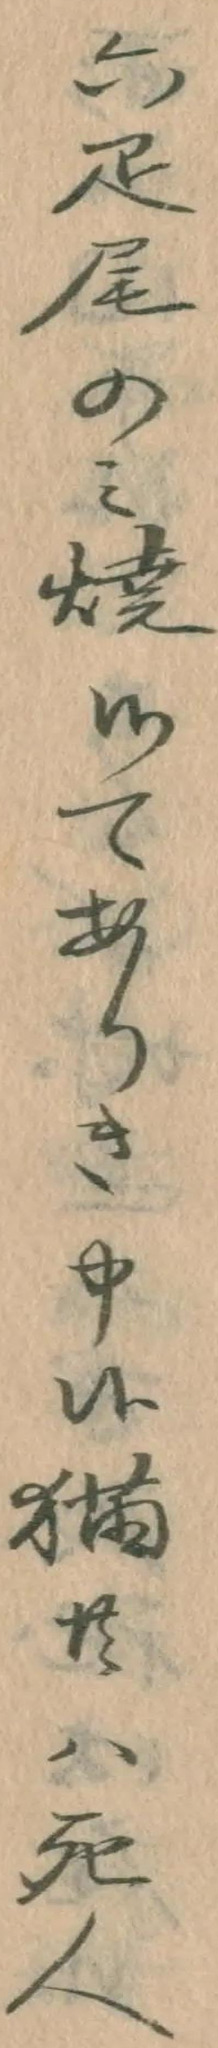六疋尾のみ焼候てありき申候猫共は死人
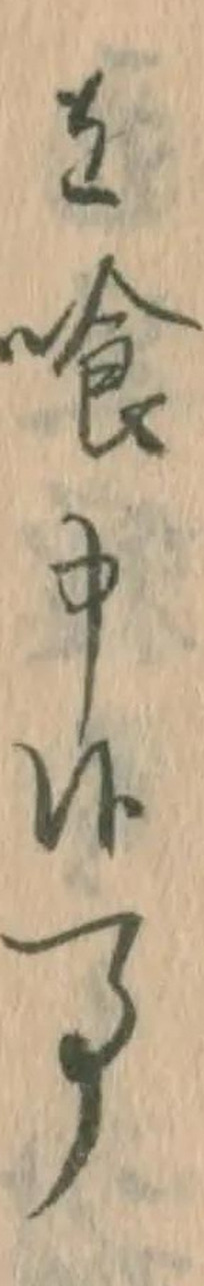を喰申候事
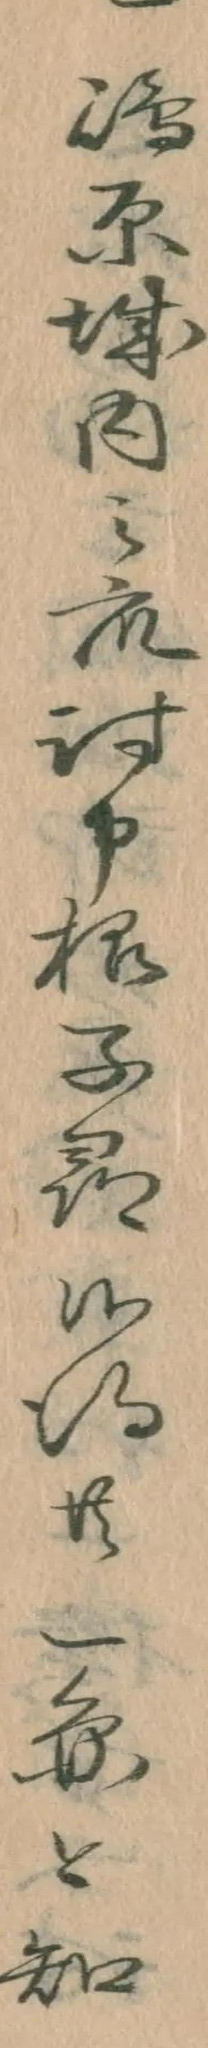一島原城内之衆討申様子尋候得共一円と知
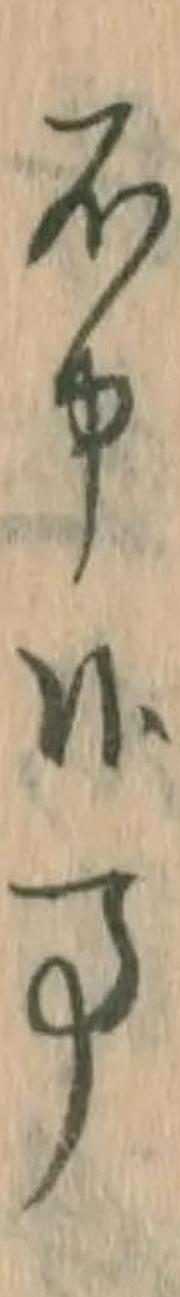不申候事
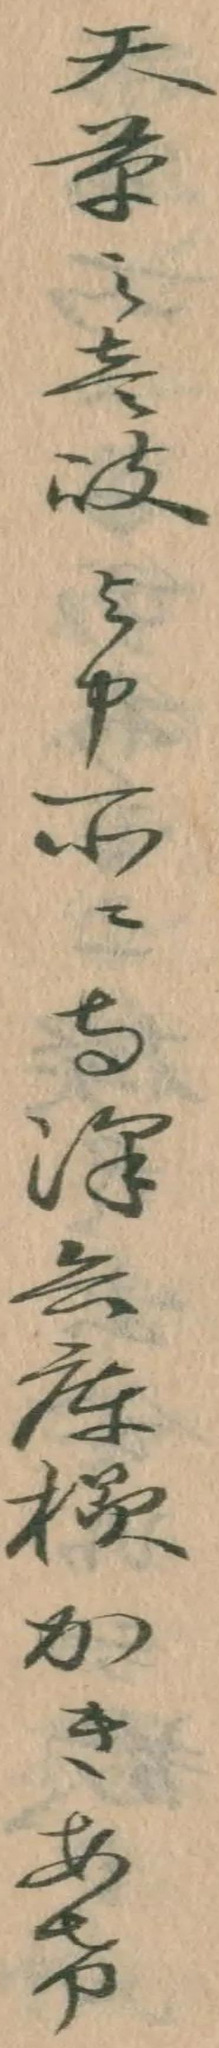一天草之壱岐与申所に寺沢兵庫様かきあ希
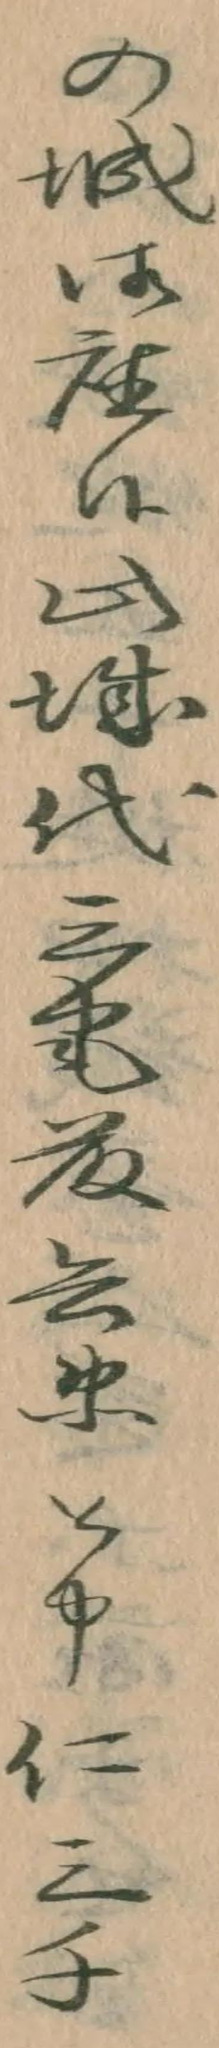の城御座候此城代三宅藤兵衛と申仁三千
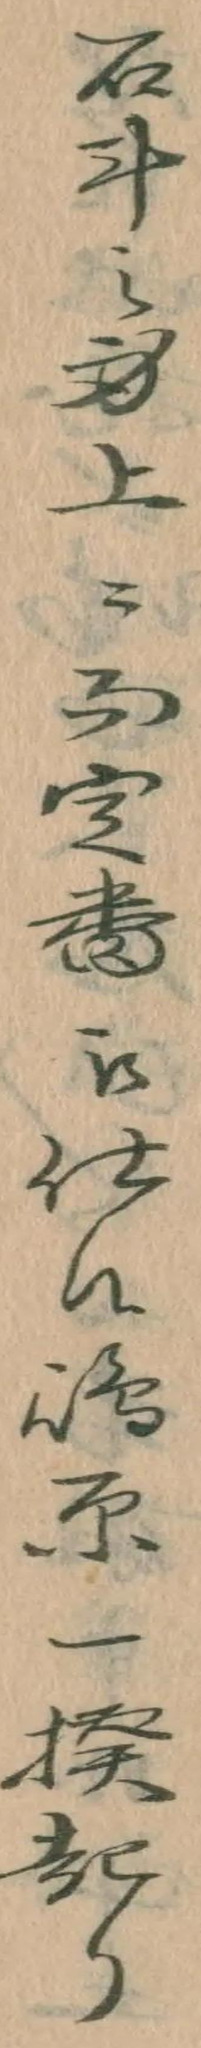石斗之身上に而定番被仕候島原一揆起り
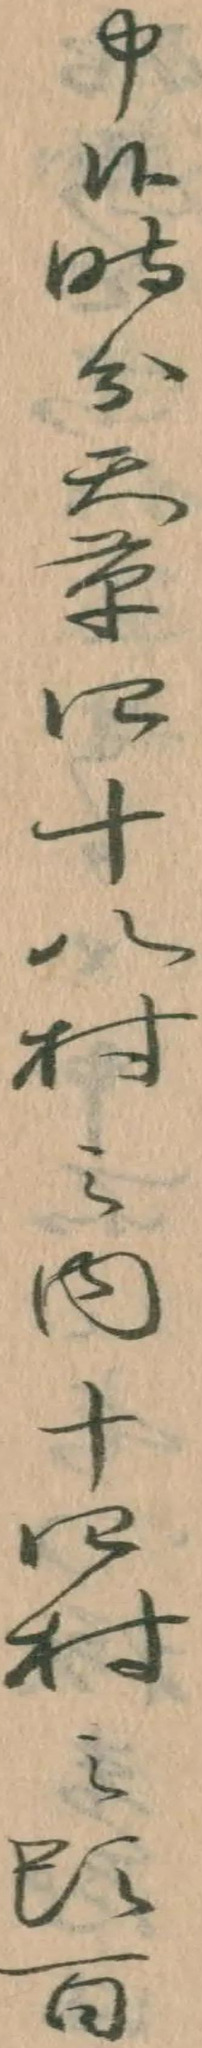申候時分天草四十八村之内十四村之頭百
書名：切支丹御退治記 49巻. [4]
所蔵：国立国会図書館 National Diet Library, JAPAN
